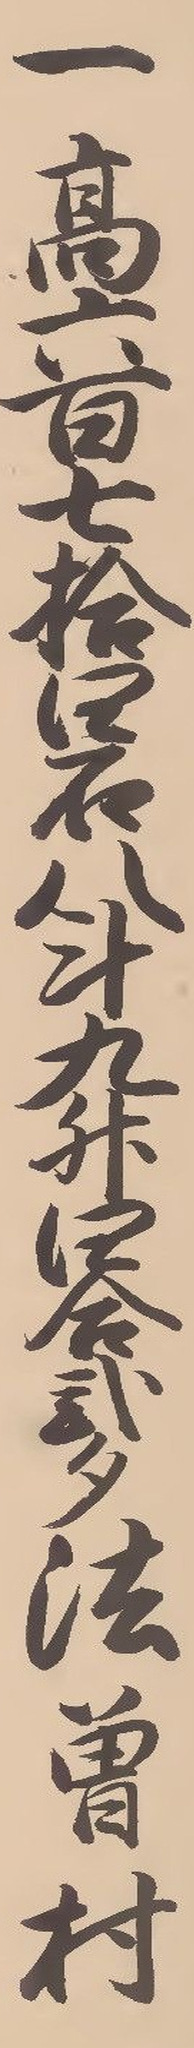一高六百七拾四石八斗九升四合弐勺法曽村
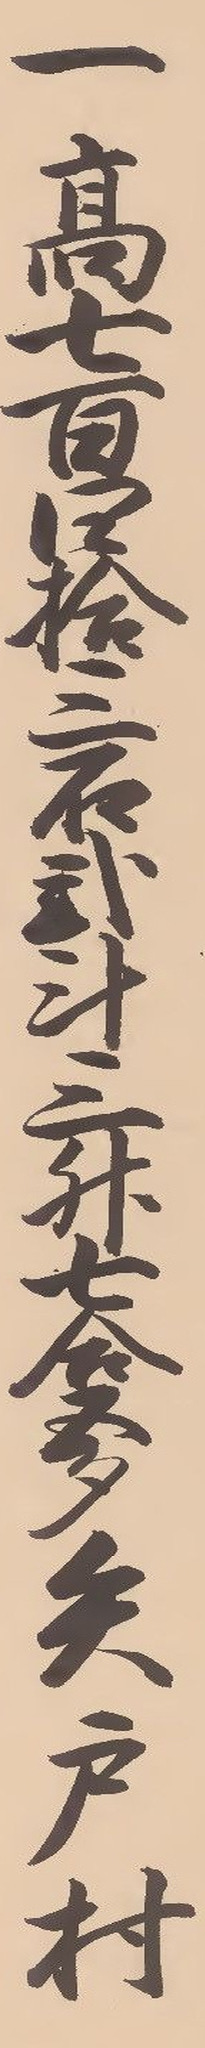一高七百四拾三石弐斗三升七合五勺矢戸村
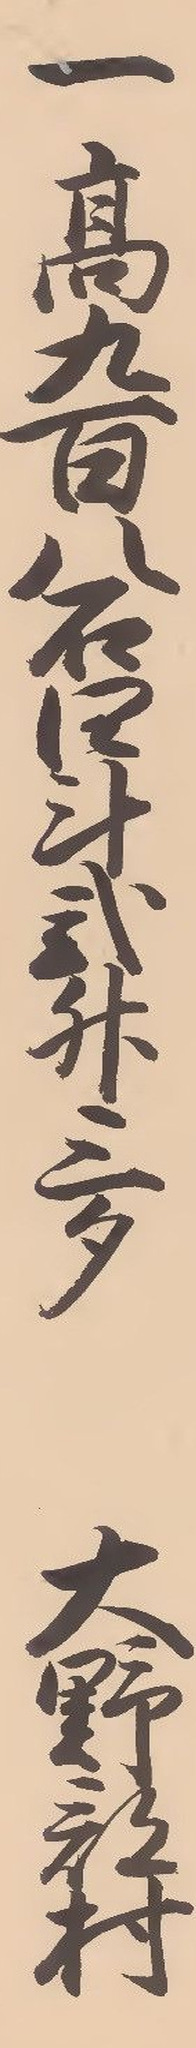一高九百八石四斗弐升三勺大野部村
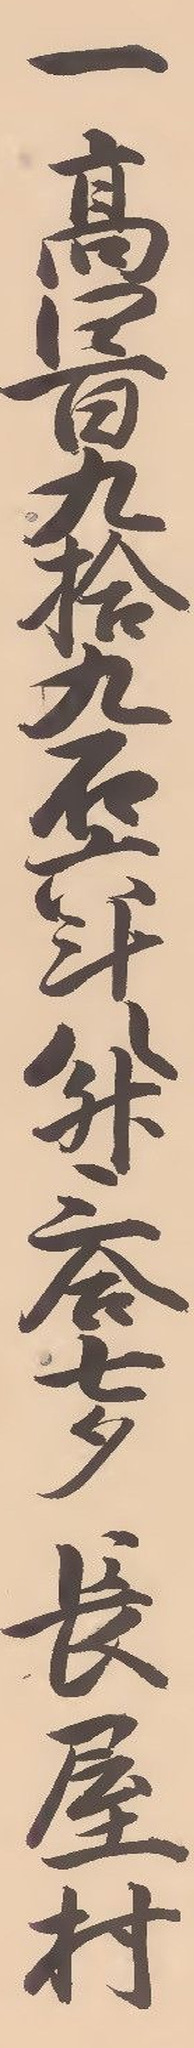一高四百九拾九石六斗八升三合七勺長屋村

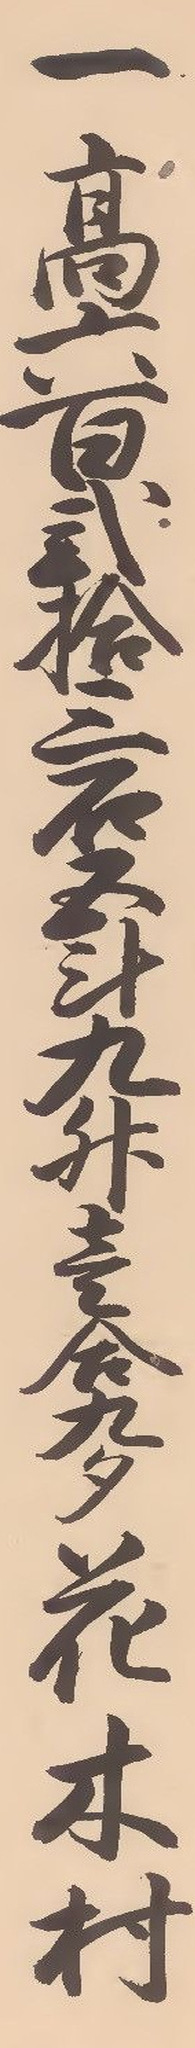一高六百弐拾三石五斗九升壱合九勺花木村
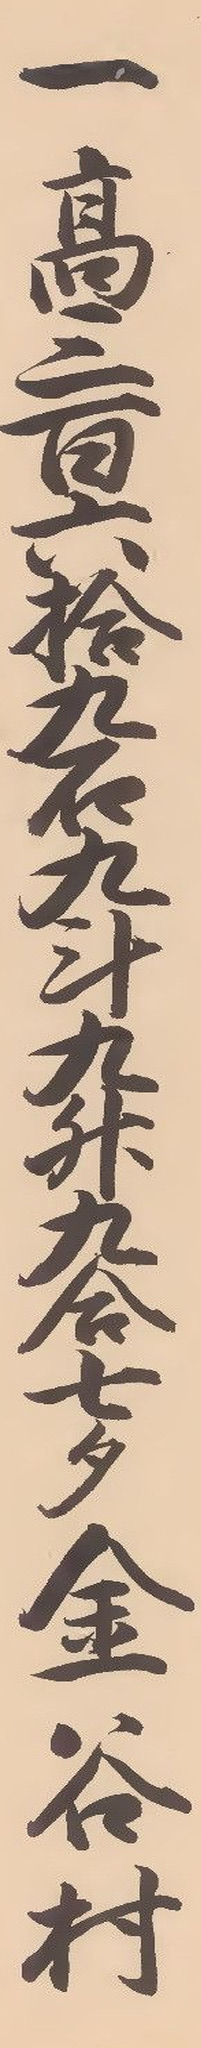一高三百六拾九石九斗九升九合七勺金谷村
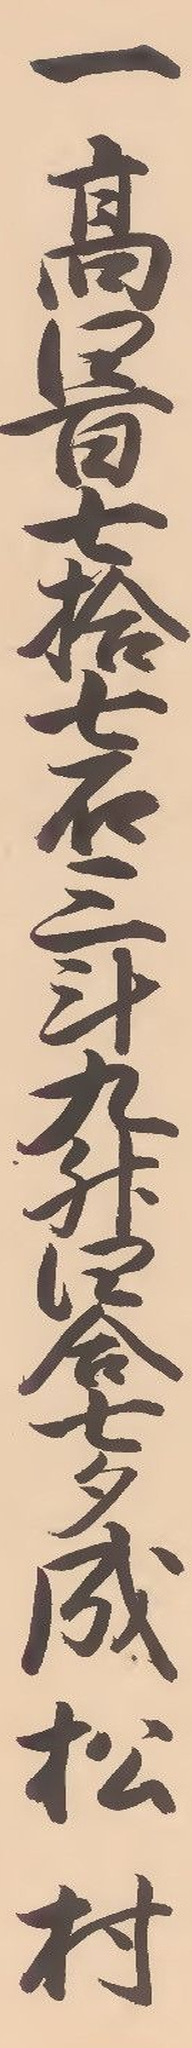一高四百七拾七石三斗九升四合七勺成松村
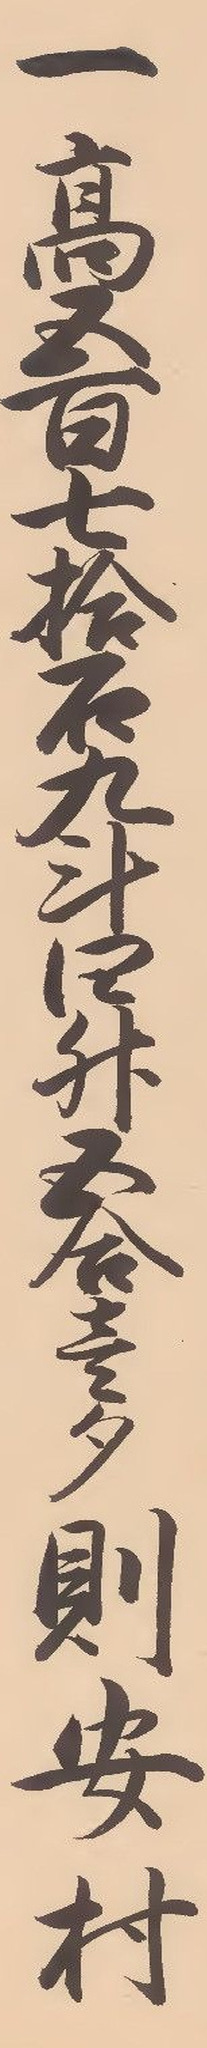一高五百七拾石九斗四升五合壱勺則安村
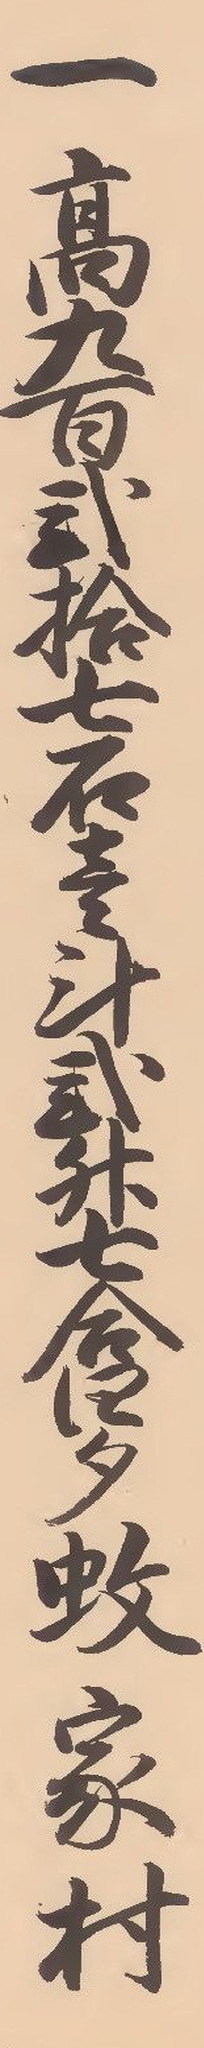一高九百弐拾七石壱斗弐升七合四勺蚊家村
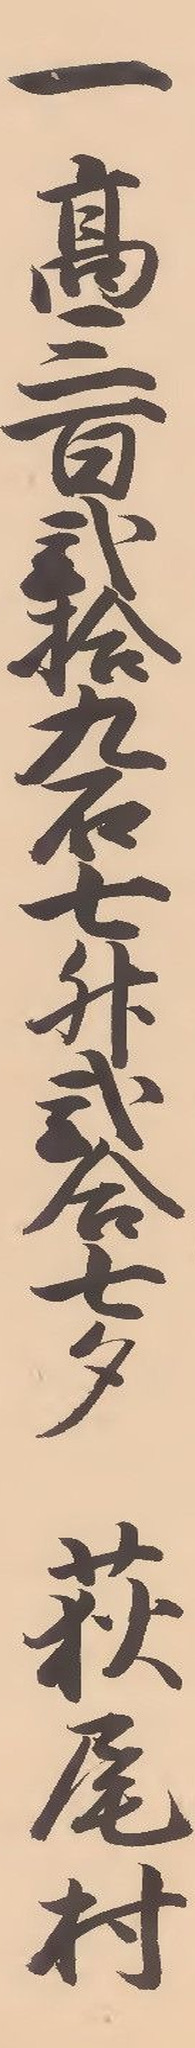一高三百弐拾九石七升弐合七勺荻尾村
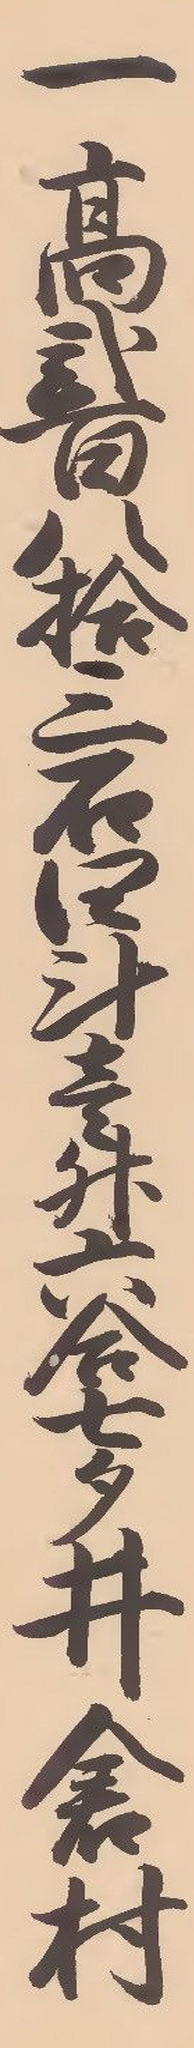一高弐百八拾三石四斗壱升六合七勺井倉村

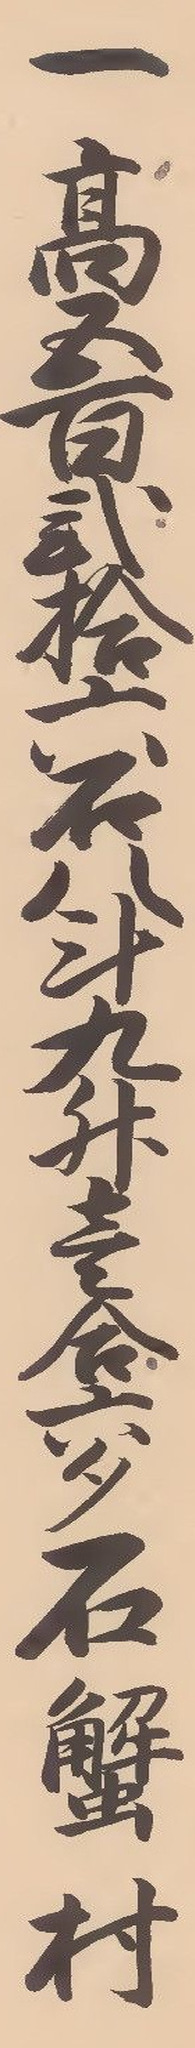一高五百弐拾六石八斗九升壱合六勺石蟹村
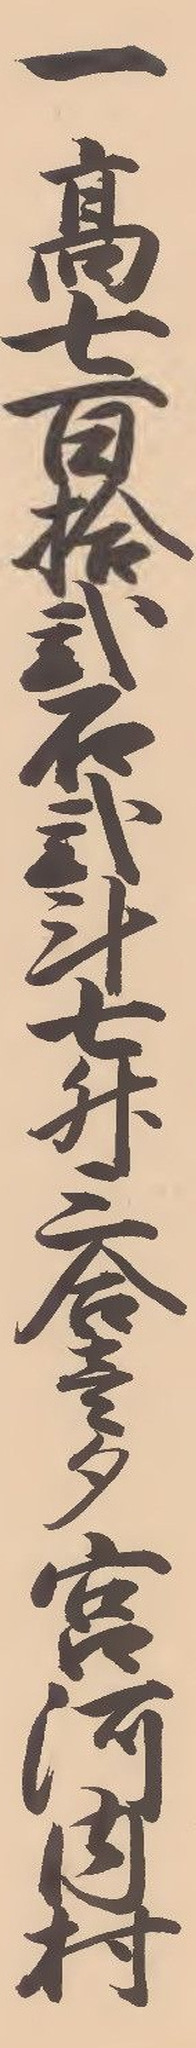一高七百拾弐石弐斗七升三合壱勺宮河内村
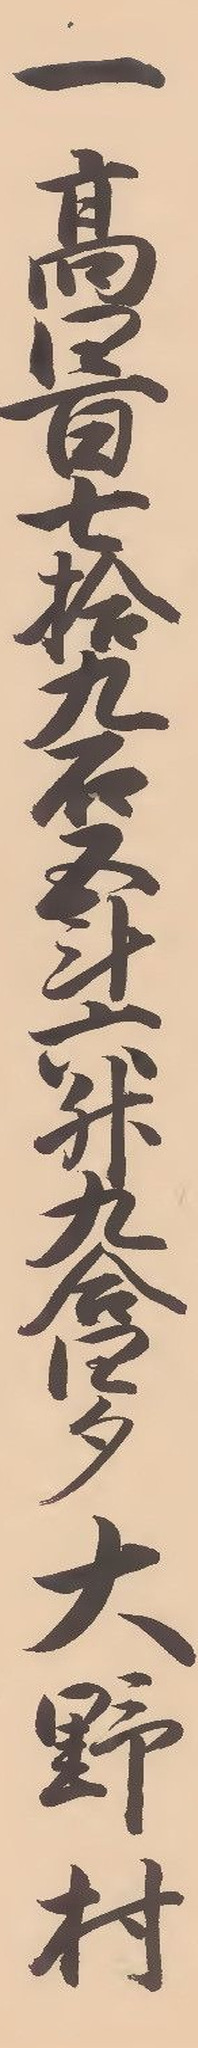一高四百七拾九石五斗六升九合四勺大野村
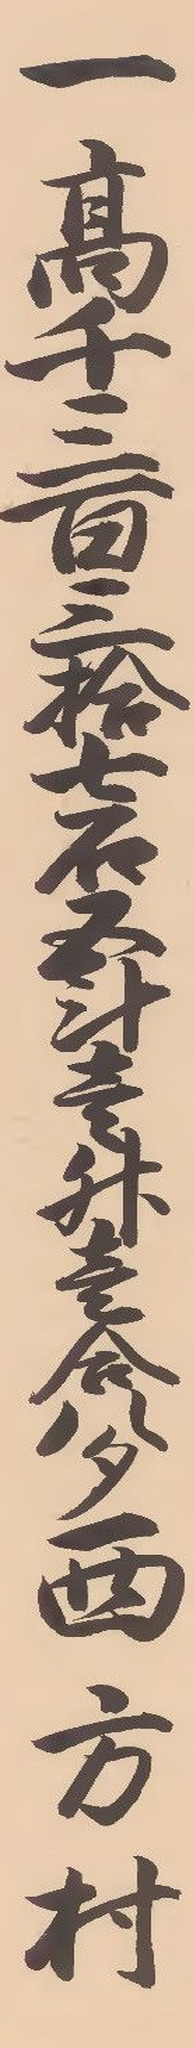一高千三百三拾七石五斗壱升壱合八勺西方村
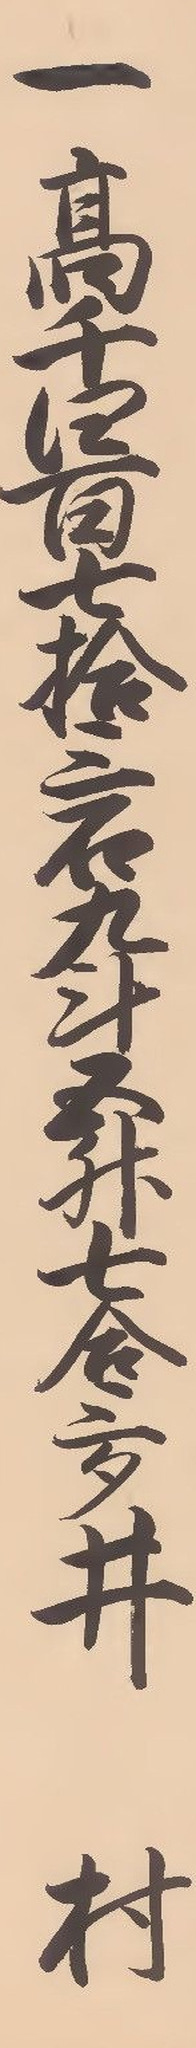一高千四百七拾三石九斗五升七合三勺井村
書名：備中国郷帳
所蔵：国立公文書館 National Archives of Japan
